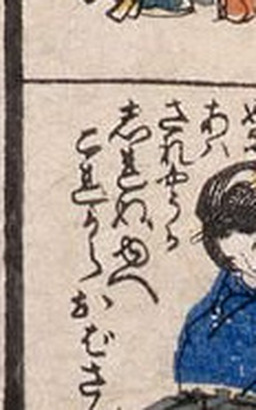しれぬゆへ
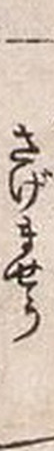さげませう
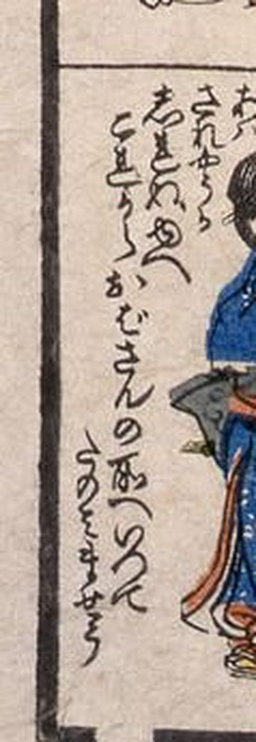これからおばさんの所へいつて
